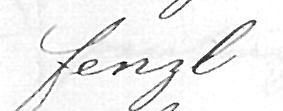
Fenzl
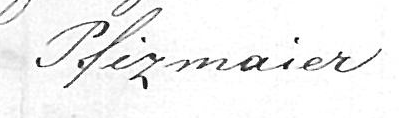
Pfizmaier
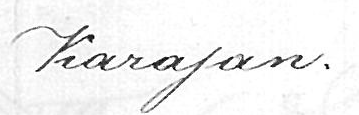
Karajan
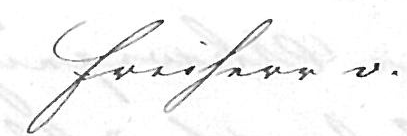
Freiherr v.
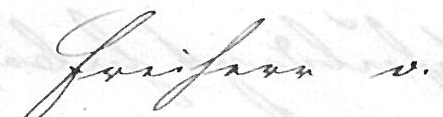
Freiherr v.
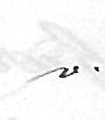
v.
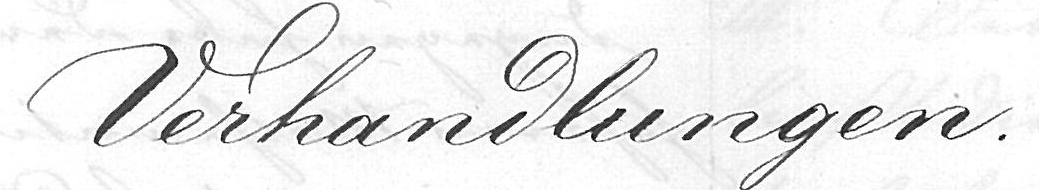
Verhandlungen.
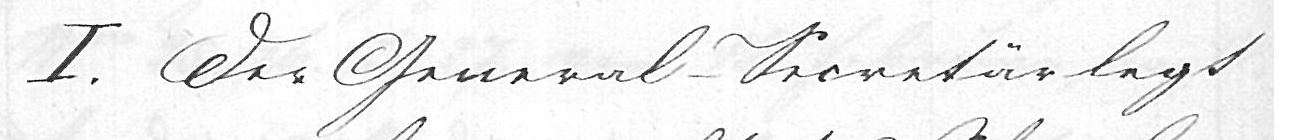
I. Der General-Secretär legt
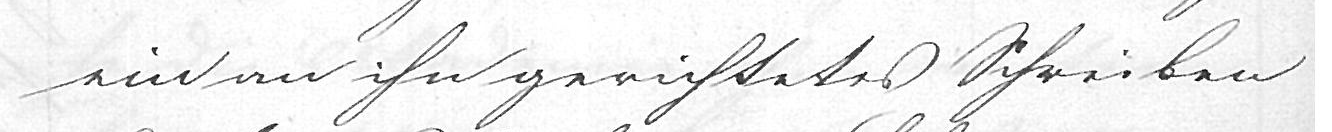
ein an ihn gerichtetes Schreiben
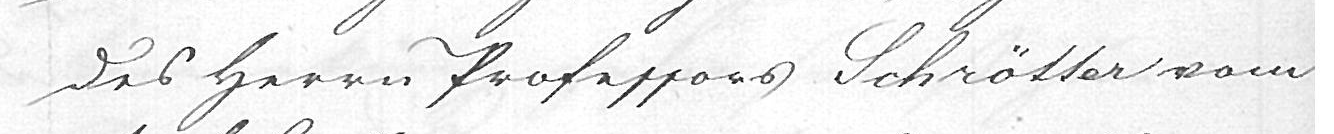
des Herrn Professors Schrötter vom
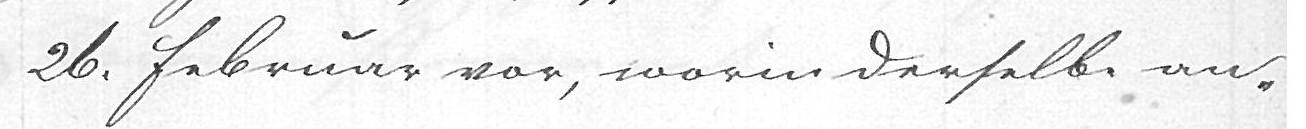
26. Februar vor, worin derselbe an-
